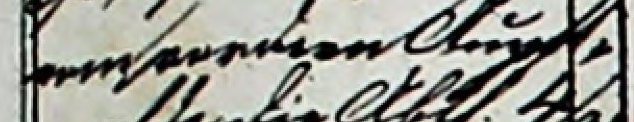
am vordern Augst„
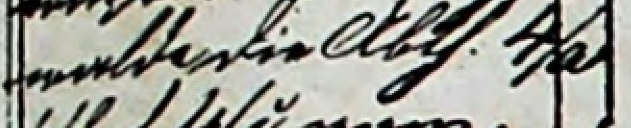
walde die Abth. 4/a
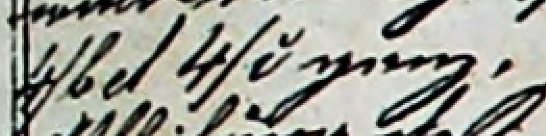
4/b et 4/c ganz
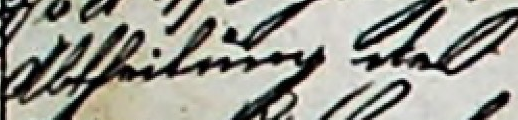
Abtheilung des
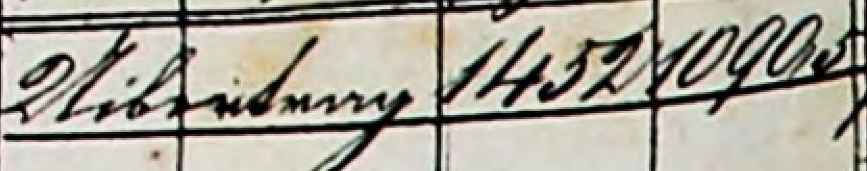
Uebertrag 1452 1090,5
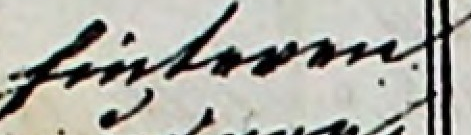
hinteren
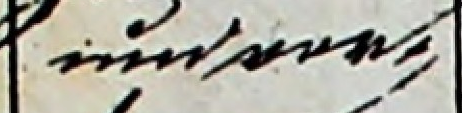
und vor„
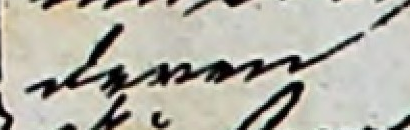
deren
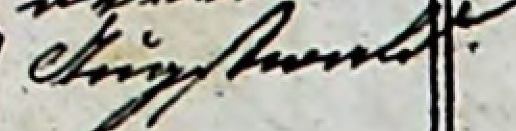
Augstwald.
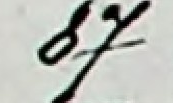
87
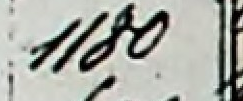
1180
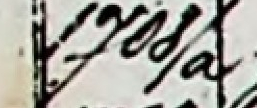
1708/a
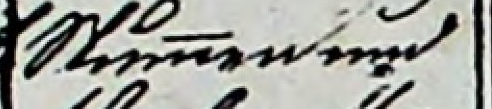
Stummen und
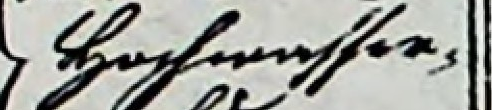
Hochwasser„
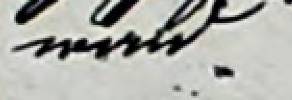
wald
